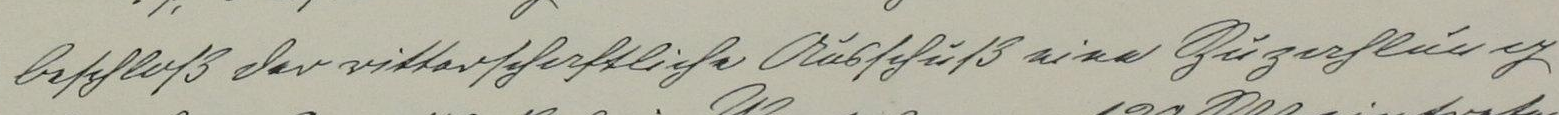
beschloß der ritterschaftliche Ausschuß eine Zuzahlung
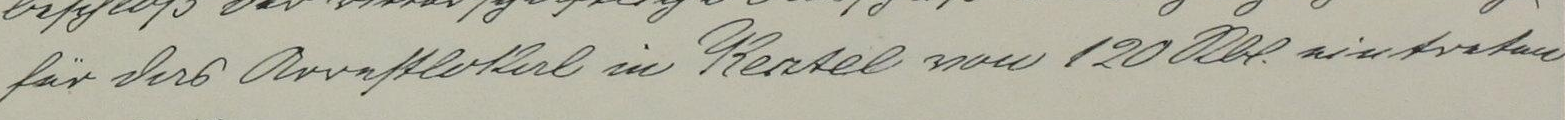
für das Arrestlokal in Kertel von 120 Rbl. eintreten
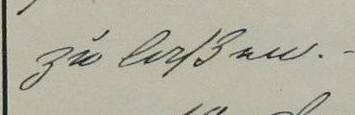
zu laßen.
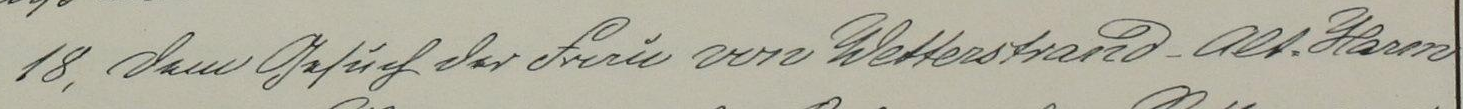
18. Dem Gesuch der Frau von Wetterstrand-Alt-Harm
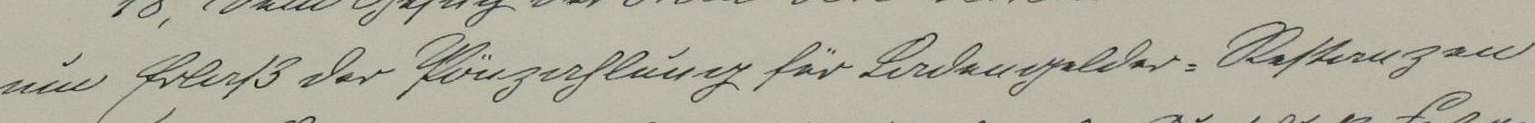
um Erlaß der Pönzahlung für Ladengelder-Restanzen
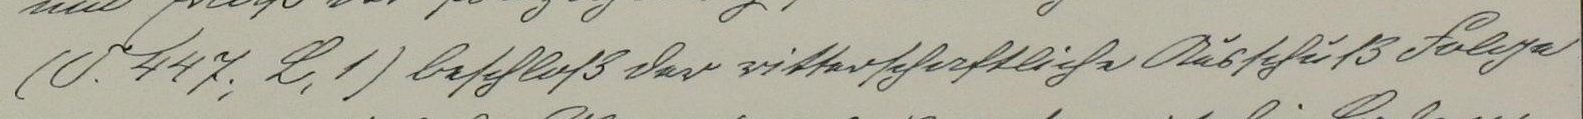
(T.447; L.1) beschloß der ritterschaftliche Ausschuß Folge
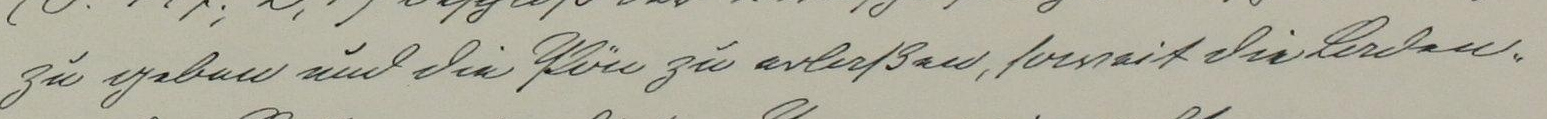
zu geben und die Pön zu erlaßen, soweit die Laden-
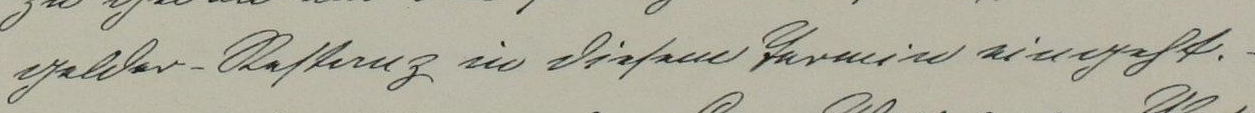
gelder-Restanz in diesem Termin eingeht.
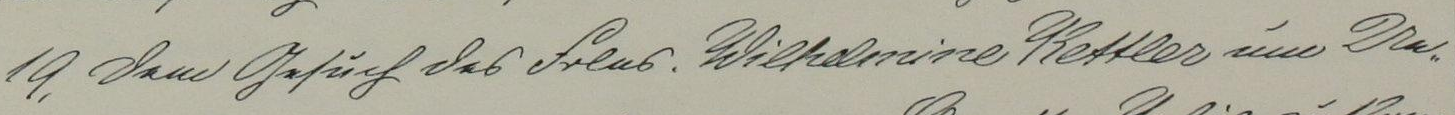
19. Dem Gesuch des Frlns. Wilhelmine Kettler um Ue-
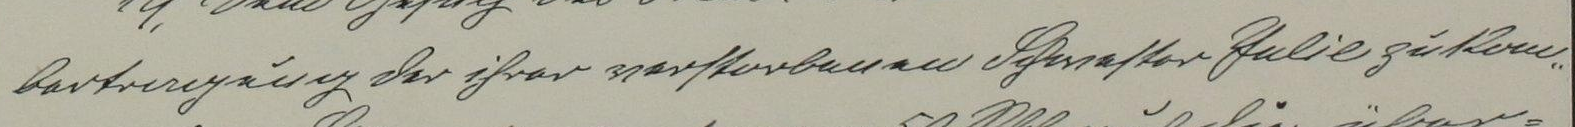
bertragung der ihrer verstorbenen Schwester Julie zukom-
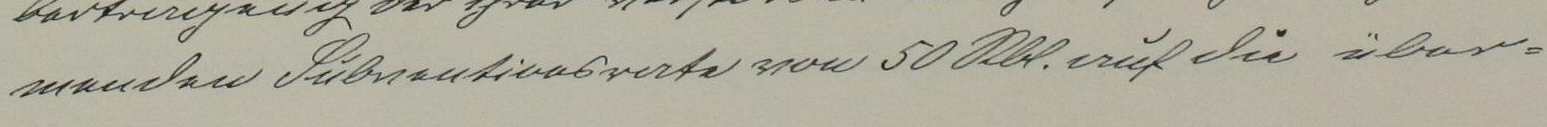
menden Subventionsrate von 50 Rbl. auf die über-
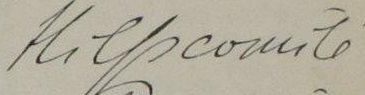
Hilfscomité
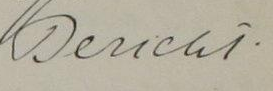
Bericht
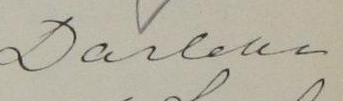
Darlehn
